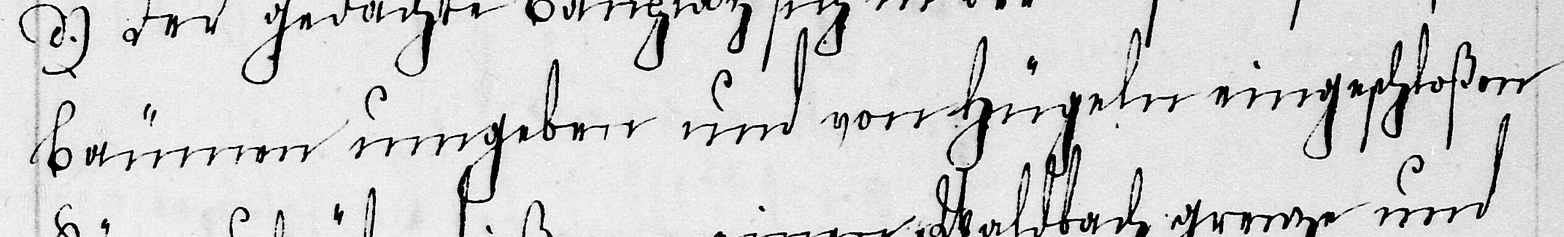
Bäumen umgeben und von Hügeln eingeschloßen
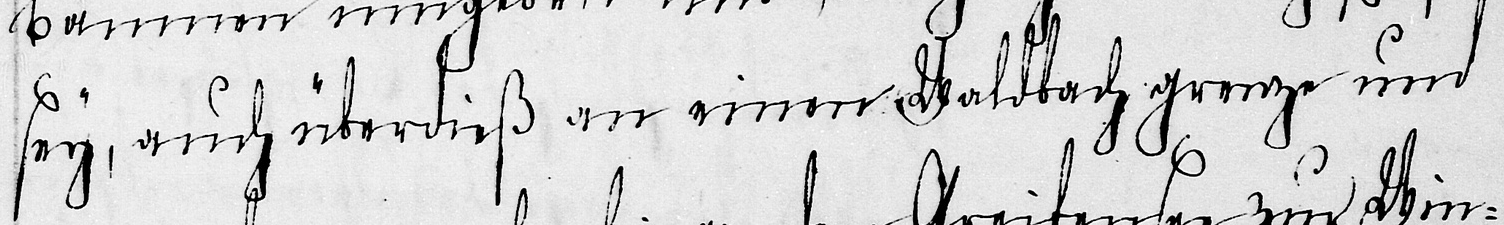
sey, auch überdieß an einen Waldbach grenze und
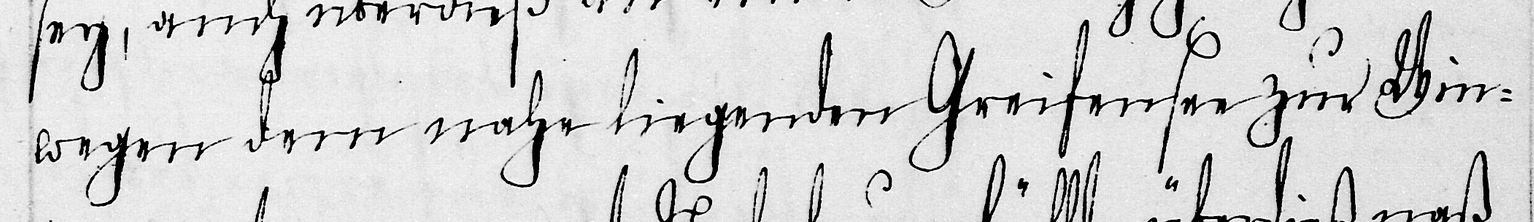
wegen dem nahe liegenden Greifensee zur Win¬
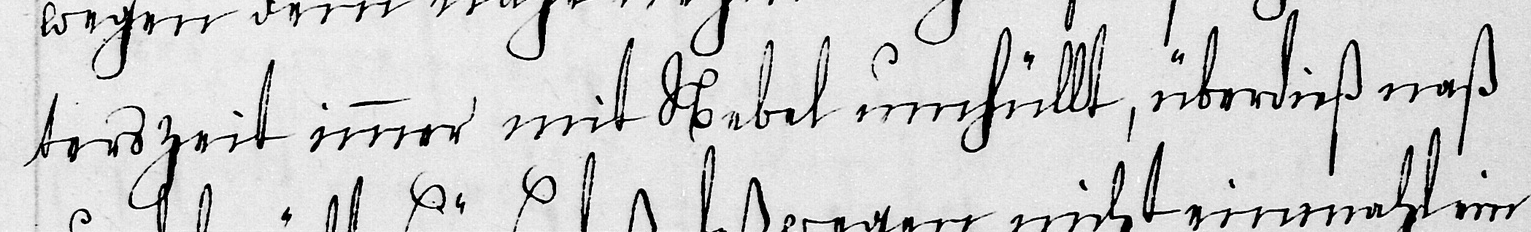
terszeit immer mit Nebel umhüllt, überdieß naß
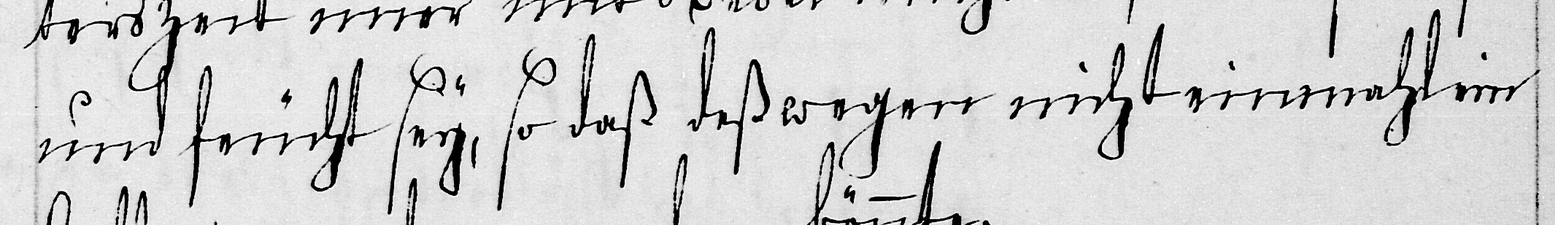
und feucht sey, so daß deßwegen nicht einmahl ein
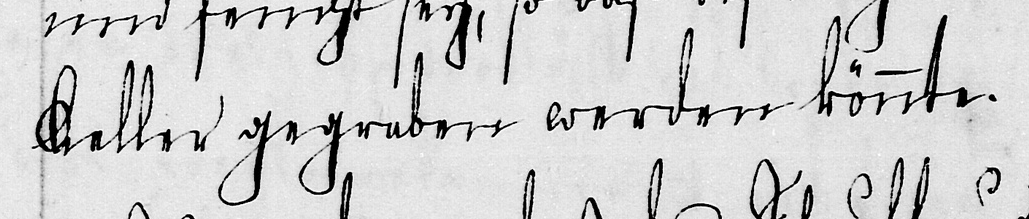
Keller gegraben werden könnte.
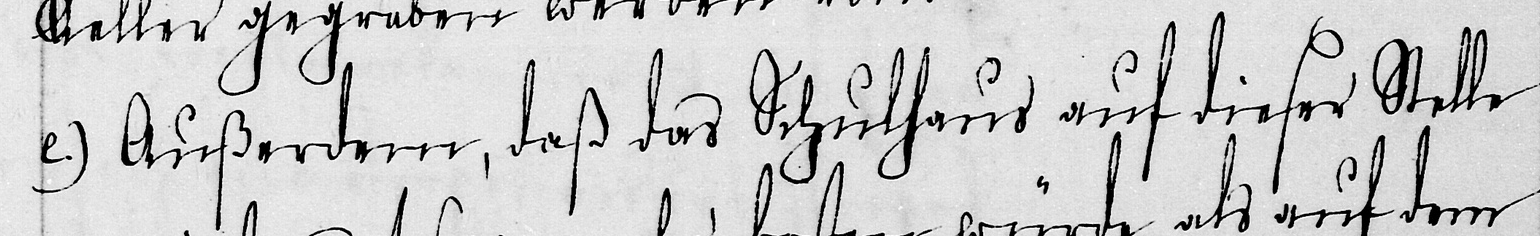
e.) Außerdem, daß das Schulhaus auf dieser Stelle
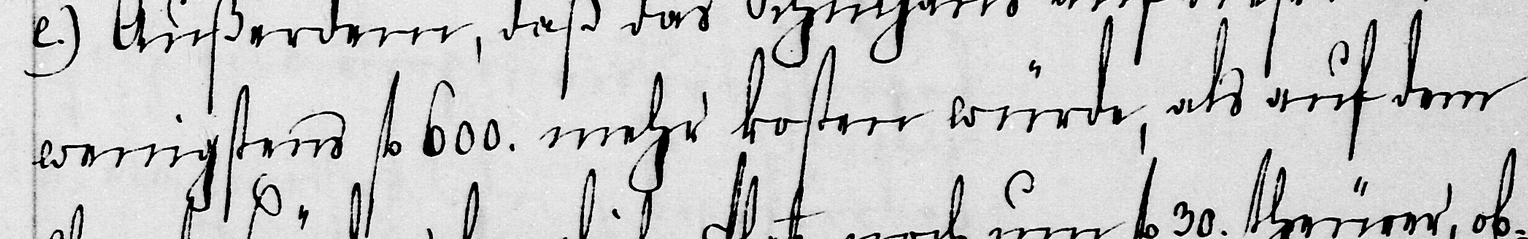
wenigstens fl. 600. mehr kosten würde, als auf dem
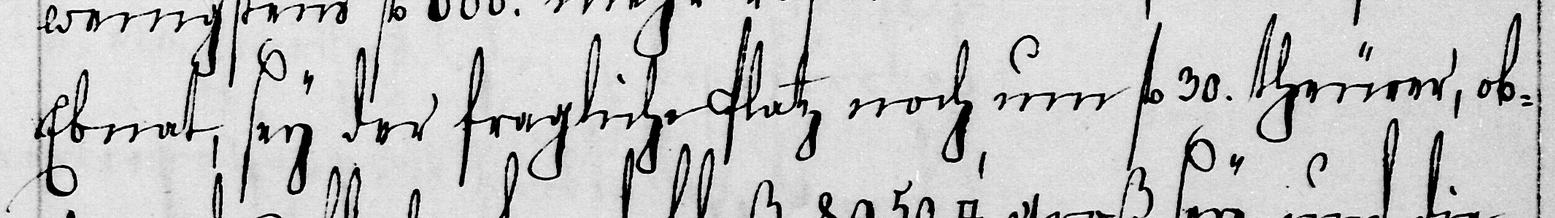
Ebnat, sey der fragliche Platz noch um fl. 30. theurer, ob¬
